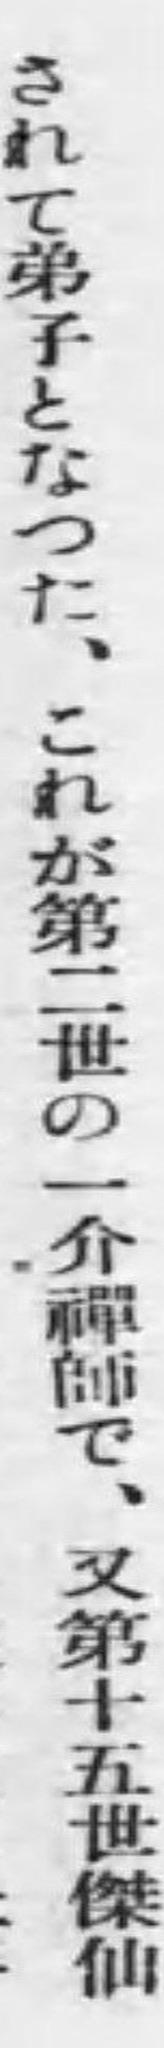されて弟子となつた、これが第二世の一介禅師で、又第十五世傑仙
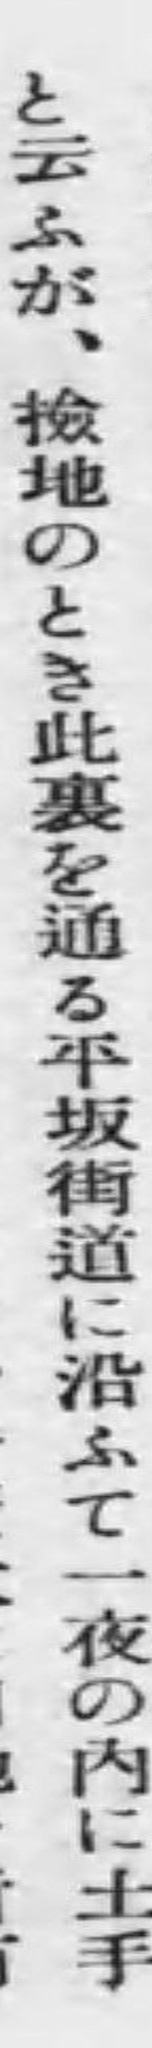と云ふが、撿地のとき此裏を通る平坂街道に沿ふて一夜の内に土手
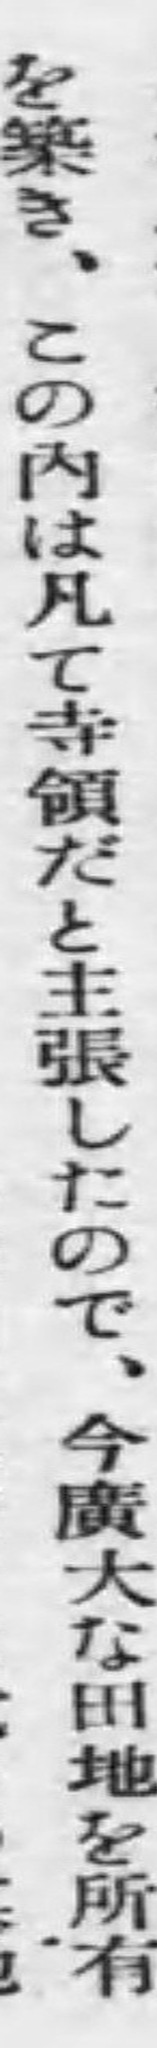を築き、この内は凡て寺領だと主張したので、今広大な田地を所有
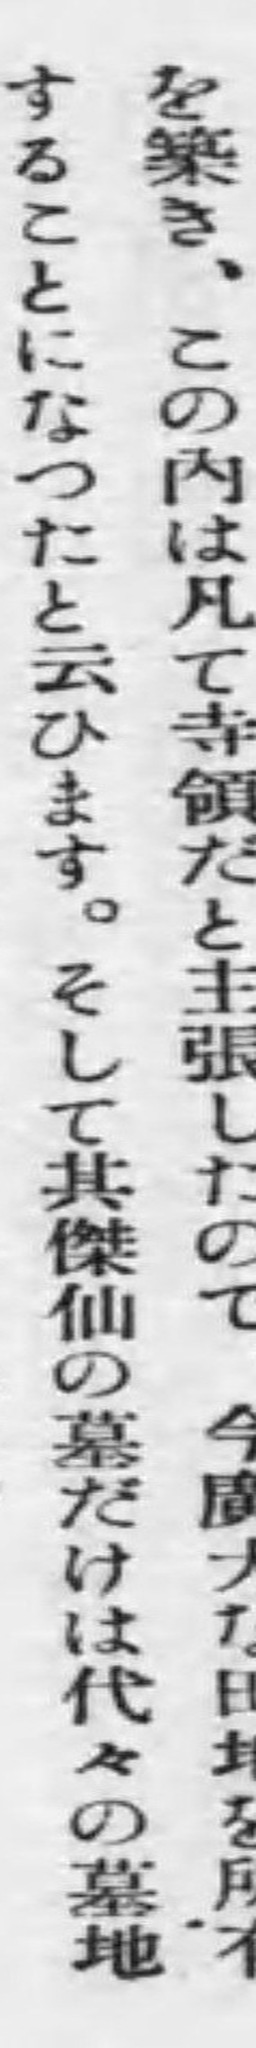することになつたと云ひます。そして其傑仙の墓だけは代々の墓地
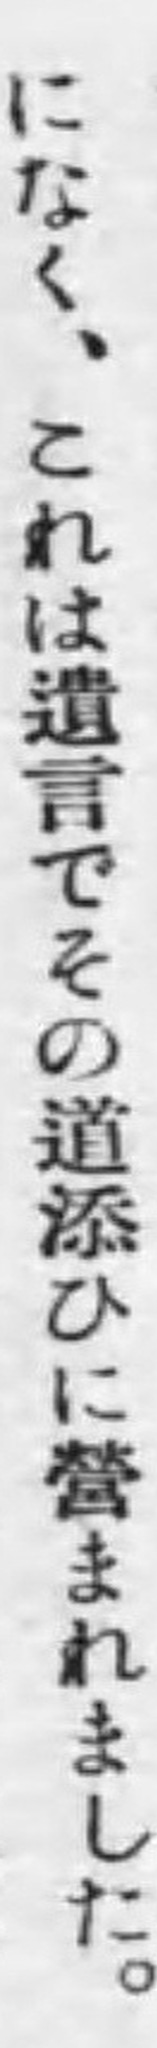になく、これは遺言でその道添ひに営まれました。
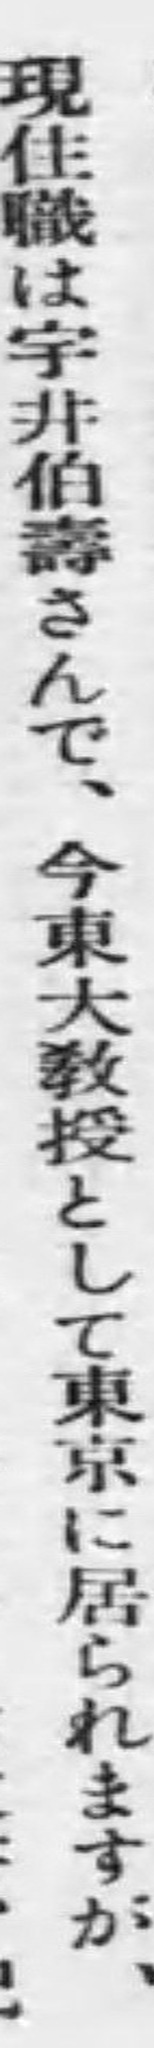現住職は宇井伯寿さんで、今東大教授として東京に居られますが、
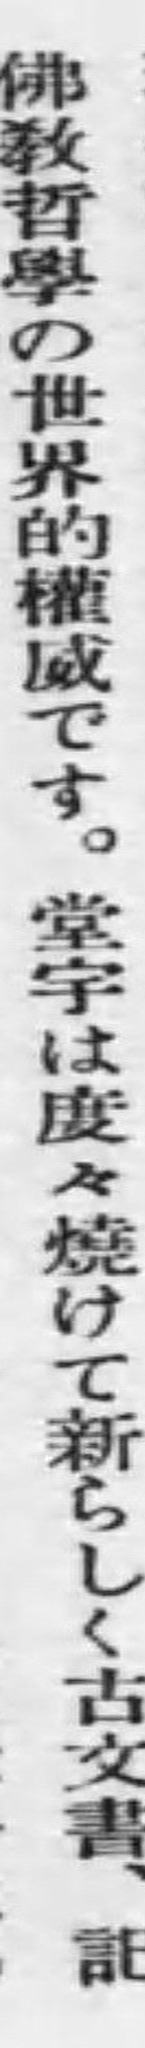仏教哲学の世界的権威です。堂宇は度々焼けて新らしく古文書、記
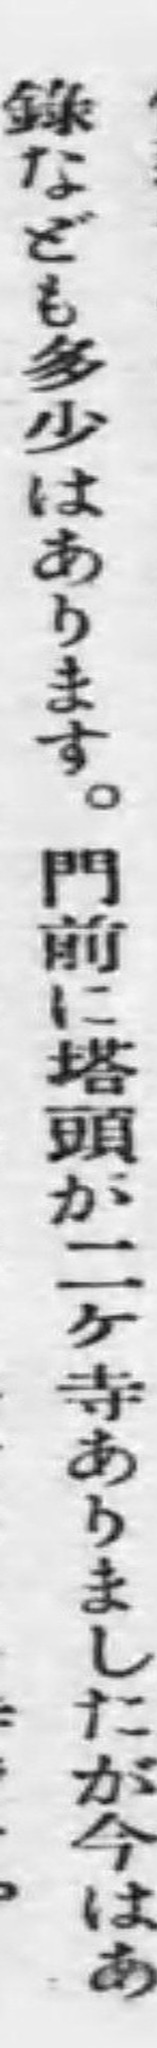録なども多少はあります。門前に塔頭が二ヶ寺ありましたが今はあ
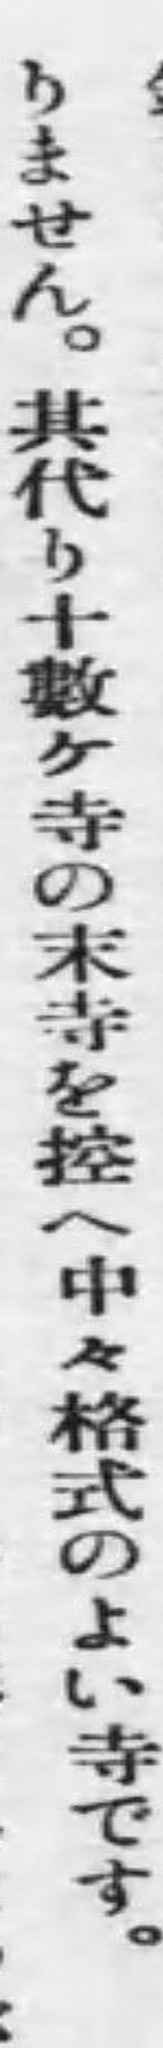りません。其代り十数ヶ寺の末寺を控へ中々格式のよい寺です。
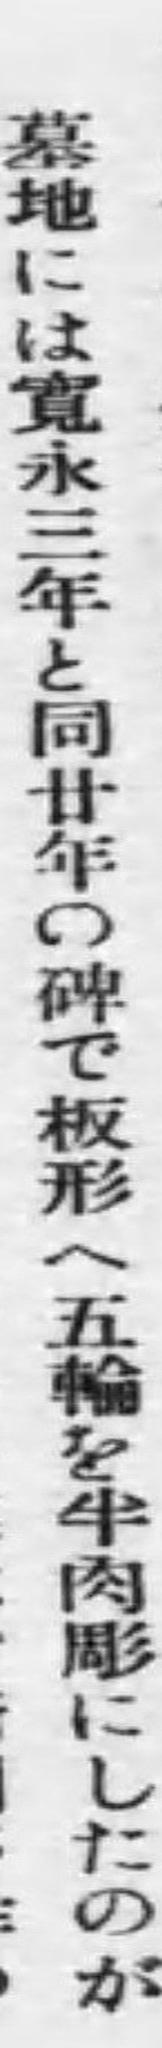墓地には寛永三年と同廿年の碑で板形へ五輪を半肉彫にしたのが
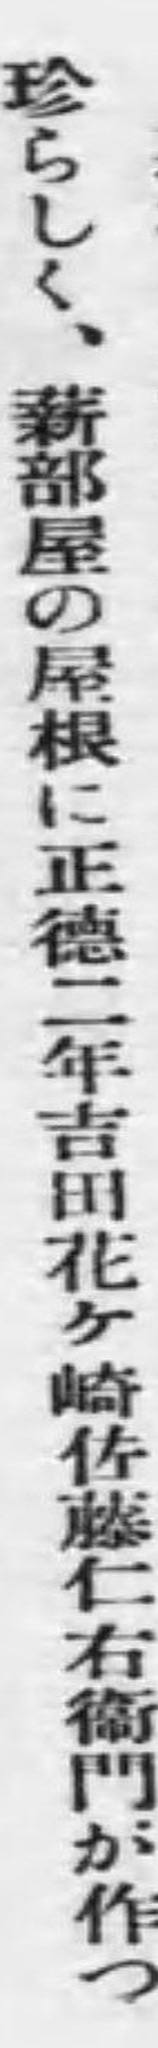珍らしく、薪部屋の屋根に正徳二年吉田花ヶ崎佐藤仁右衛門が作つ
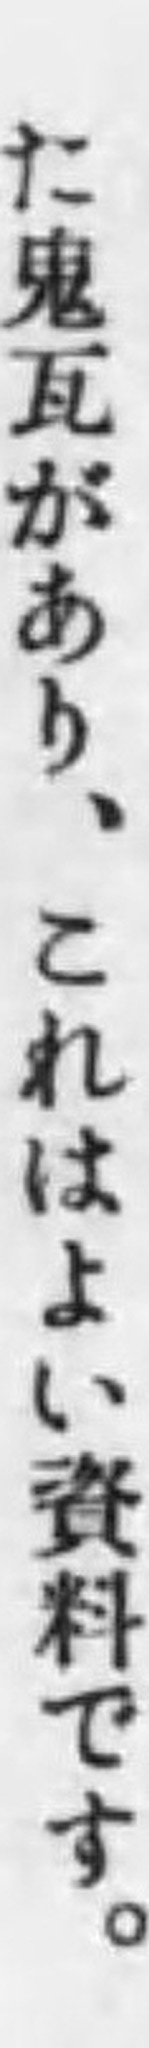た鬼瓦があり、これはよい資料です。
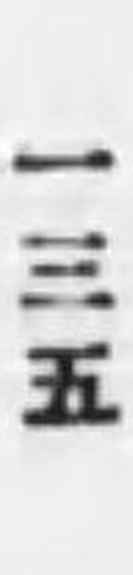一三五

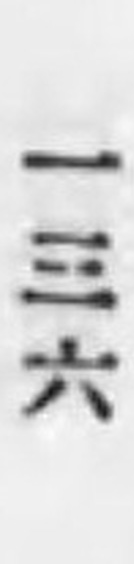一三六
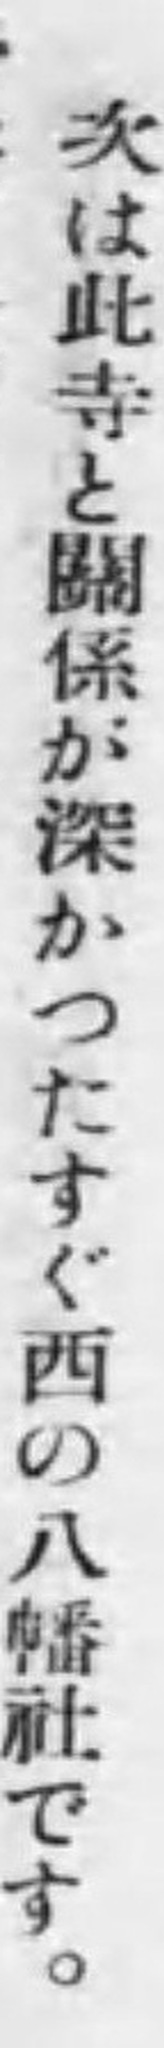次は此寺と関係が深かつたすぐ西の八幡社です。
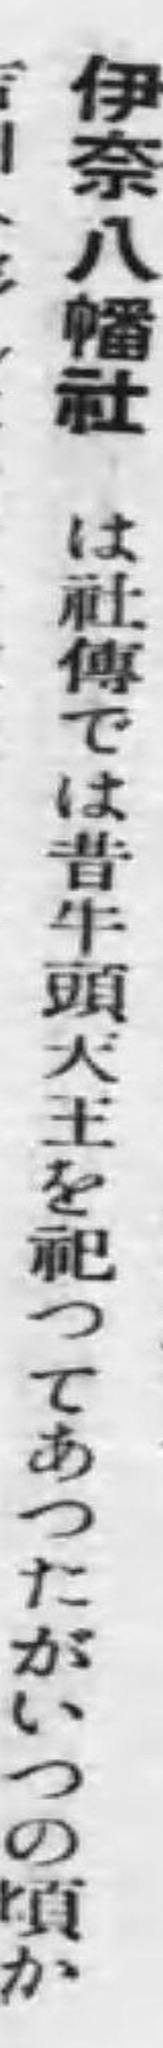伊奈八幡社は社伝では昔牛頭天王を祀つてあつたがいつの頃か
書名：東三河道中記 : 豊橋市及其附近案内
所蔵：国立国会図書館 National Diet Library, JAPAN
